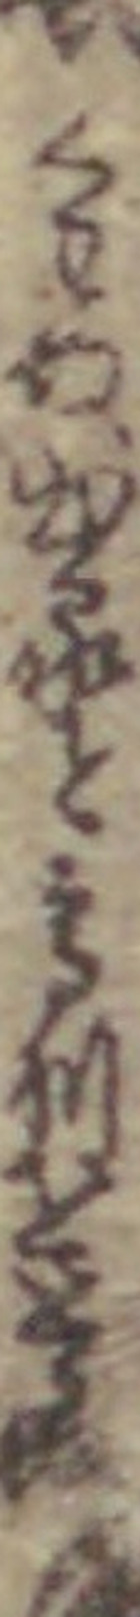くわぬ出家と高利をとらぬ
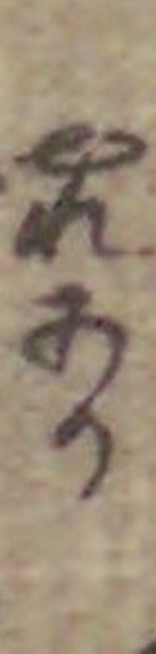やれあり
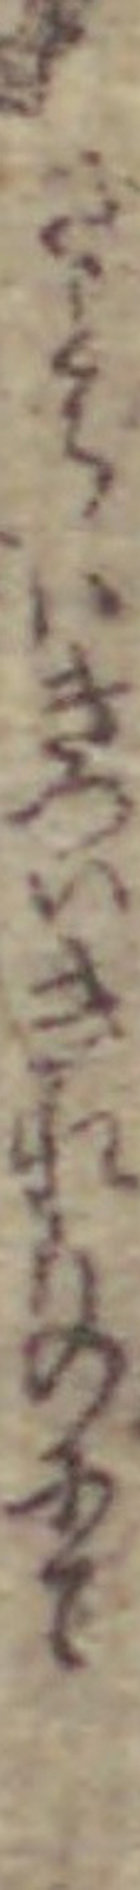ざとうはきついきれものにて
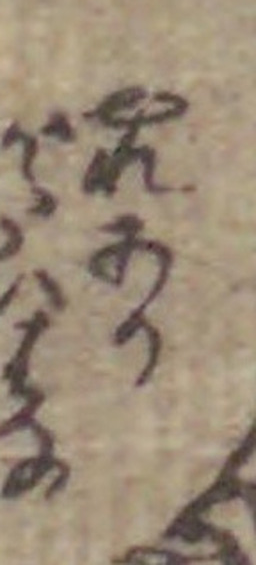がたいはな
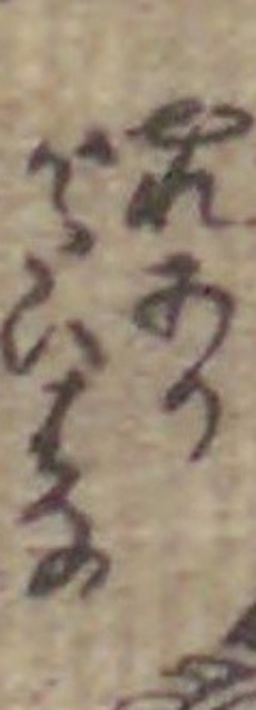がたいはな
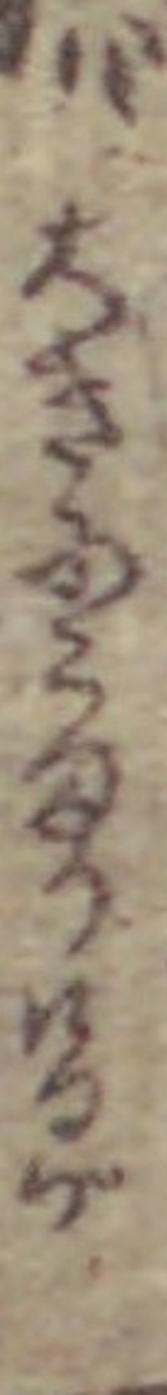大きにこまりけるが
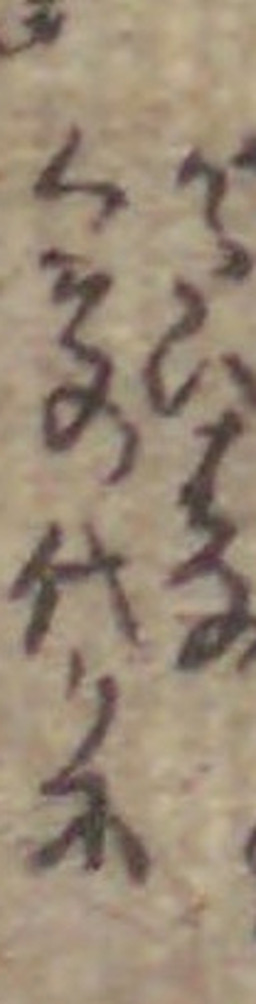くその代りに
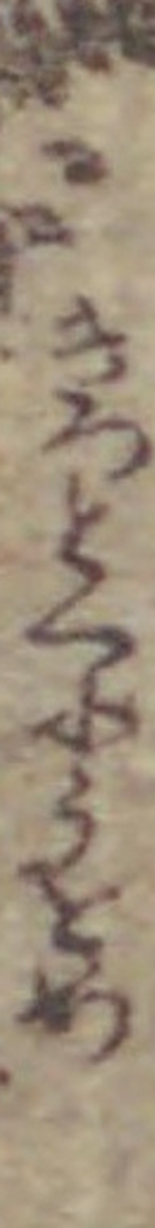きつとくふうをめ
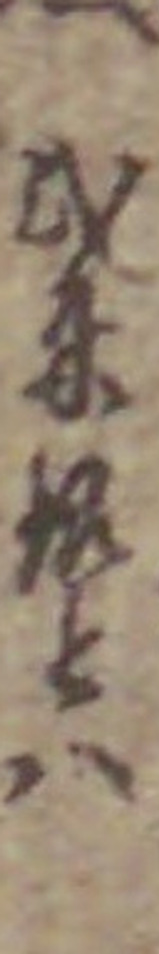弐朱銀とは
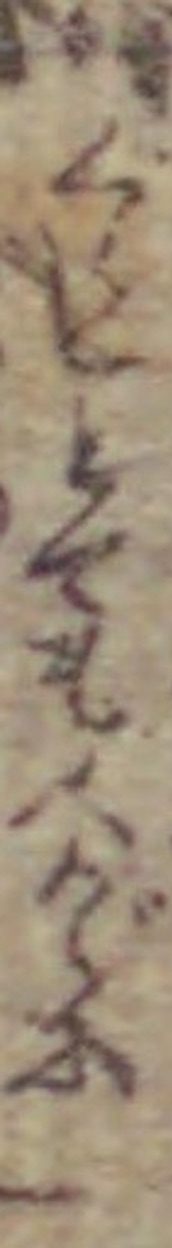ぐらしとても人がらに
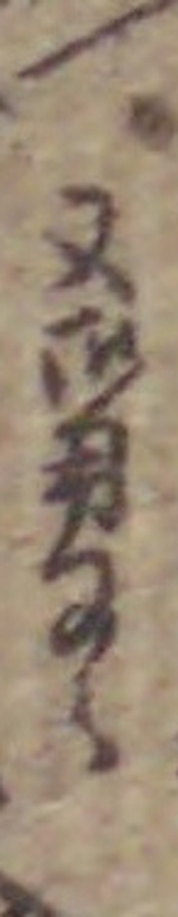又御用なら
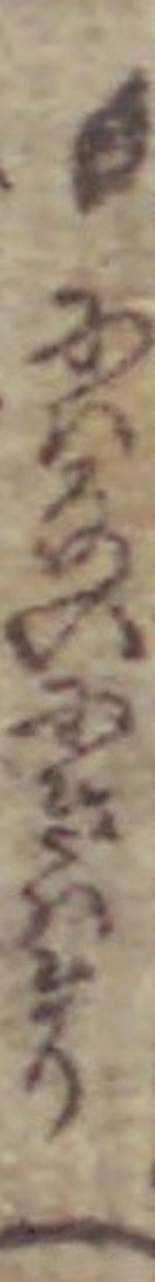にはないにきはまり
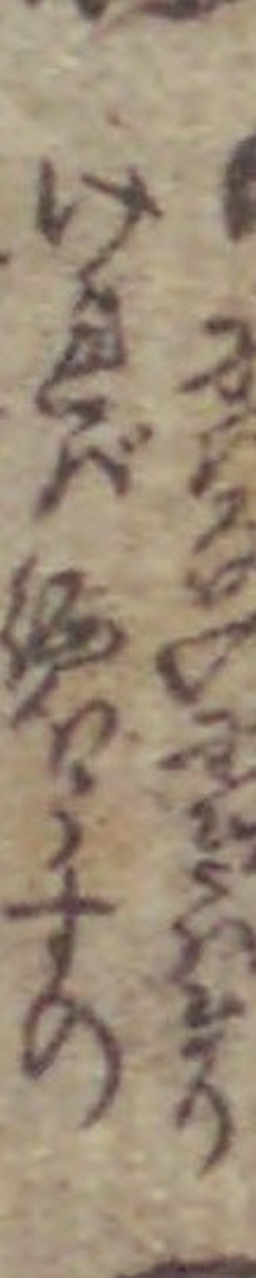ければ酒ほうすの
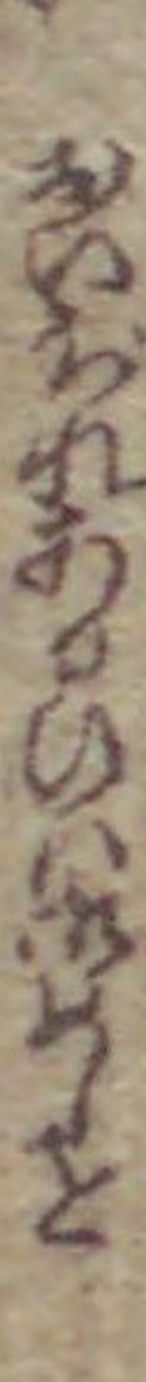おいぼれあるいは御めしを
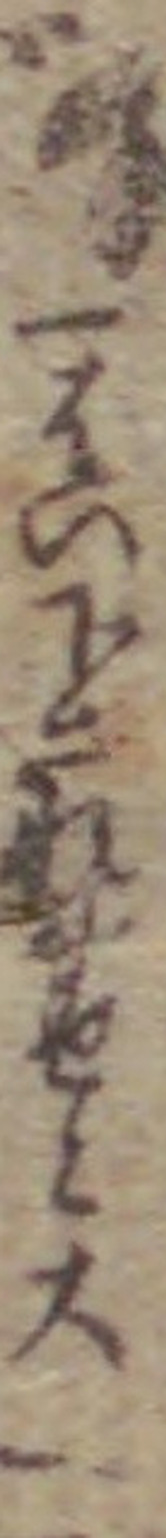一はい下されませと大
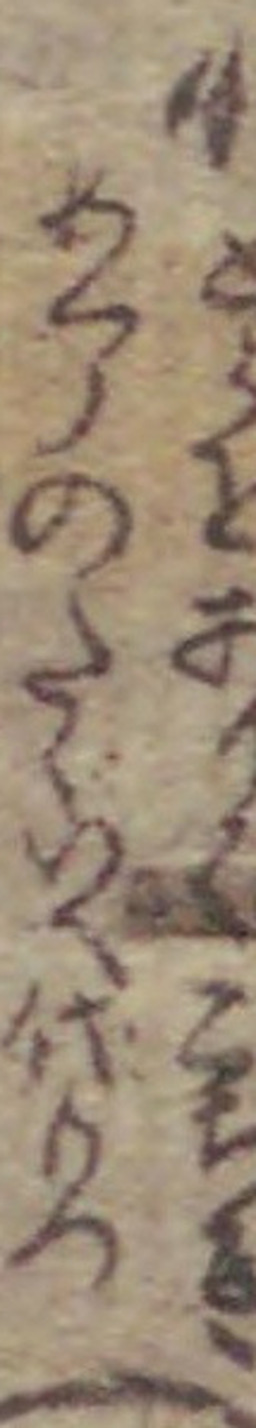めくらのたぐいへ代もつ
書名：止而道致虚録 3巻
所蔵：国立国会図書館 National Diet Library, JAPAN
